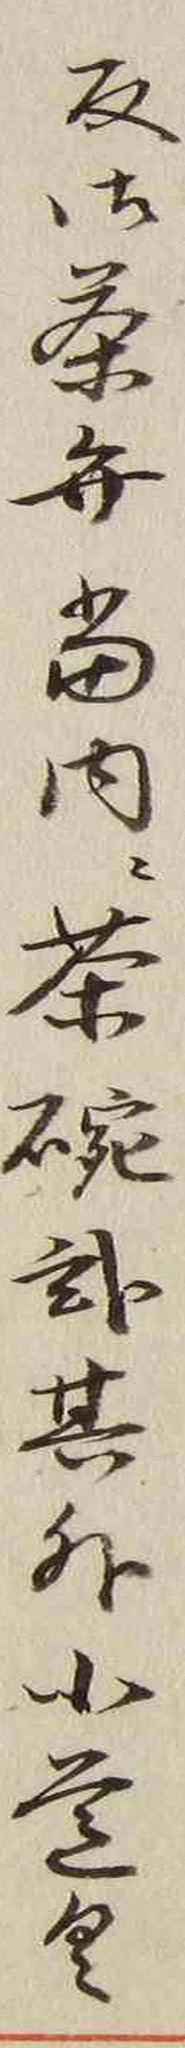反御茶弁当内に茶碗弐其外小道具
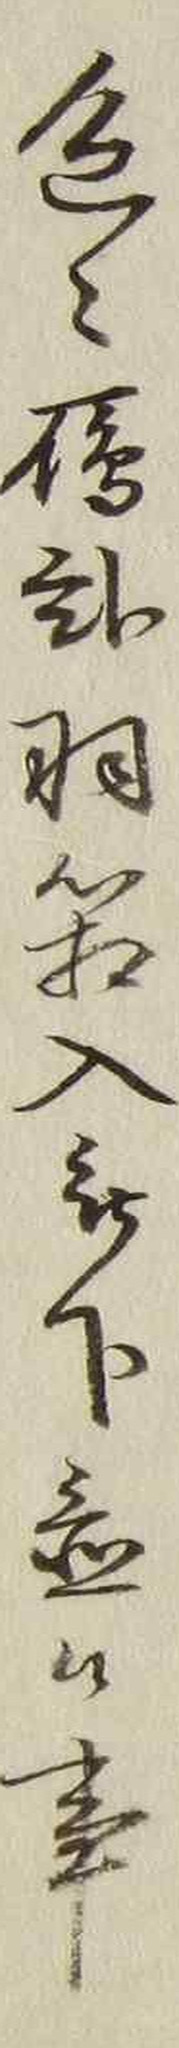色々雁弐羽箱入被下置候事
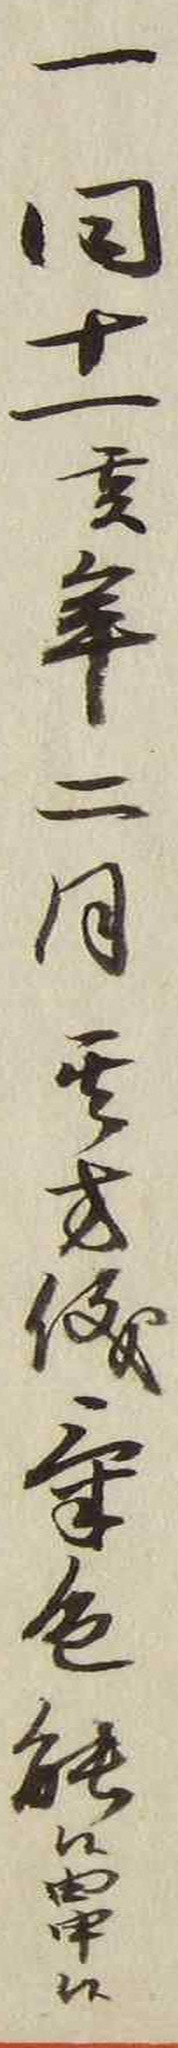一同十一亥年二月其方儀気色能候由申候

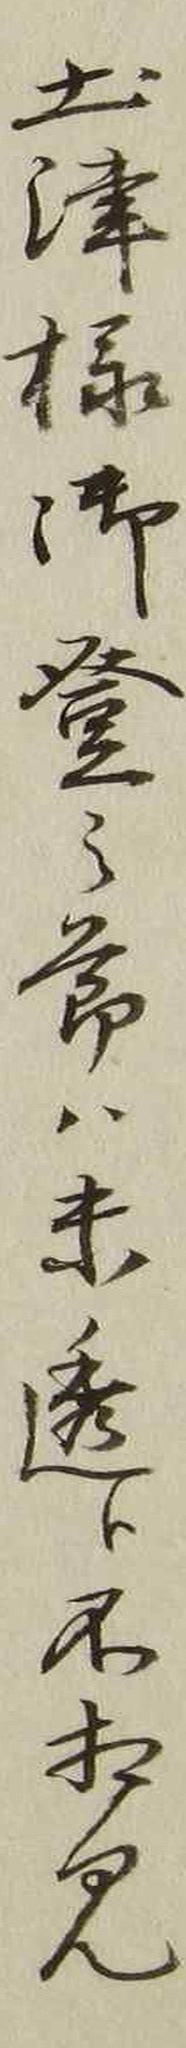土津様御登之節は未透と不相見
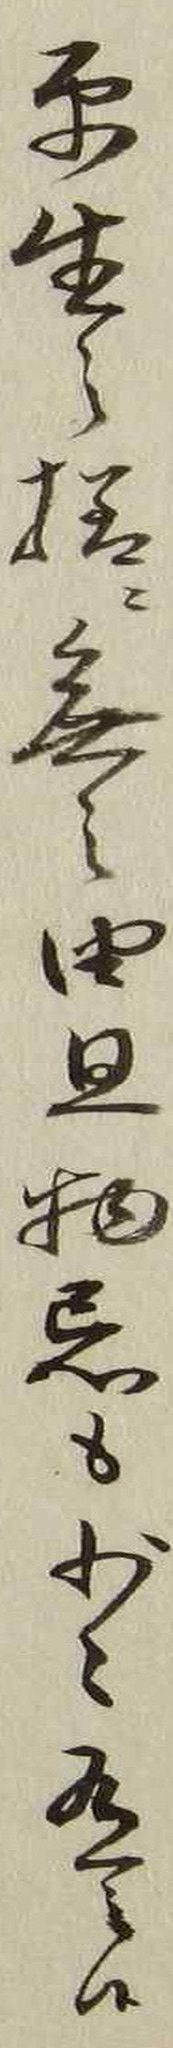平生之様に無之由且物忌も少々有之候
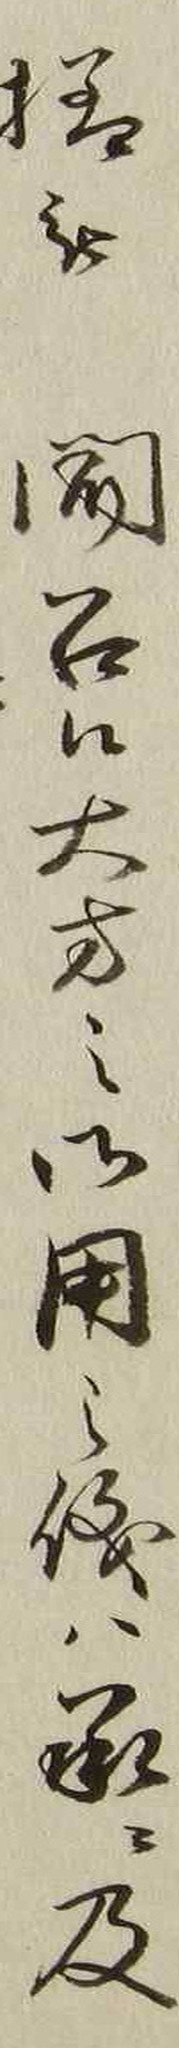様被聞召候大方之御用之儀は承に及
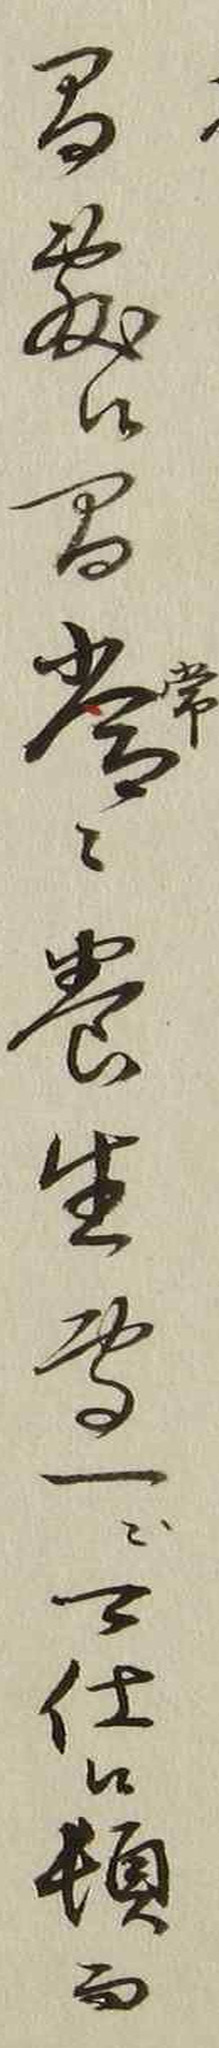間敷候間常々養生専一に可仕候頓而
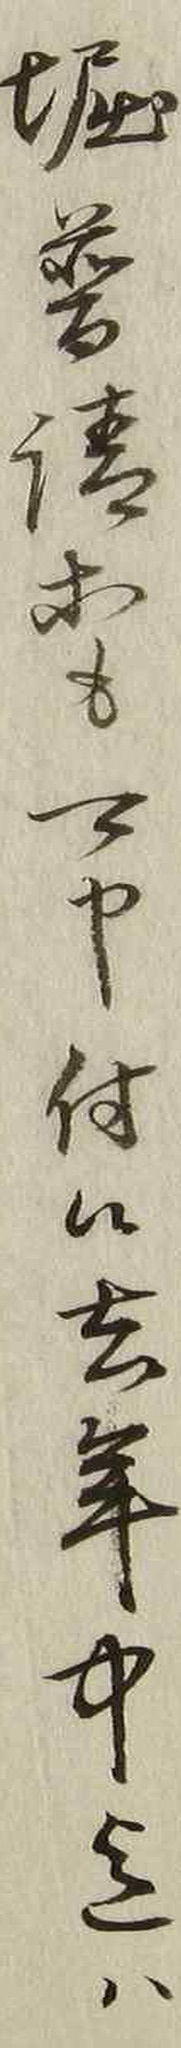堀普請等も可申付候去年中迄は
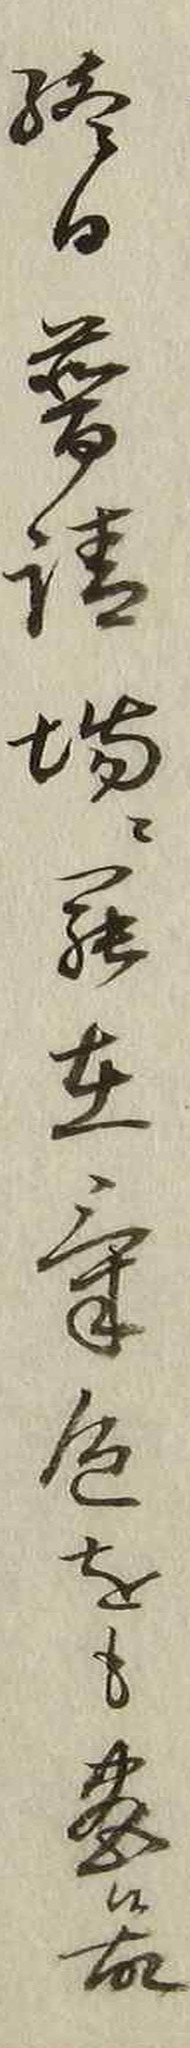終日普請場に罷在気色をも尽候故
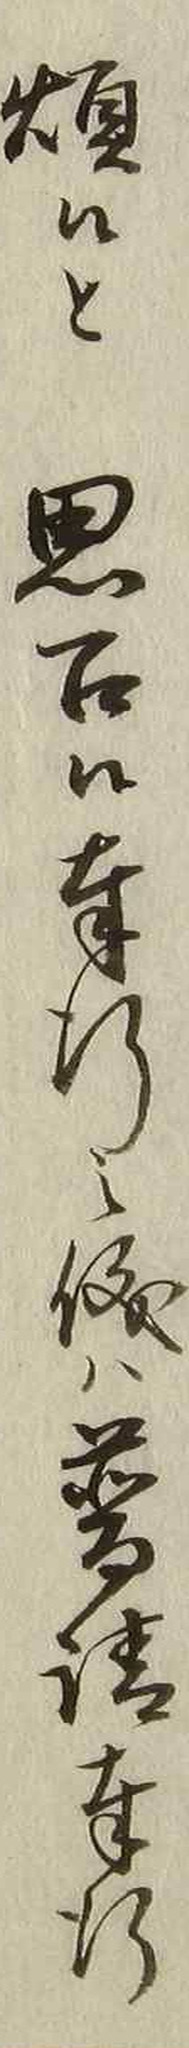煩候と思召候奉行之儀は普請奉行
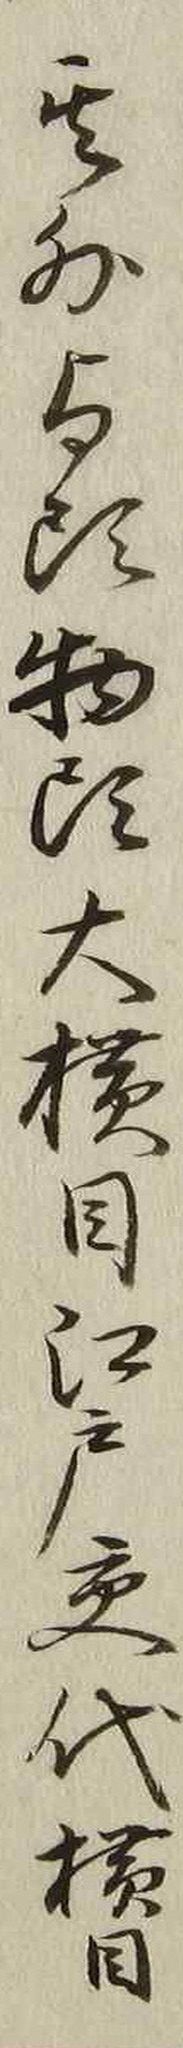其外与頭物頭大横目江戸交代横目
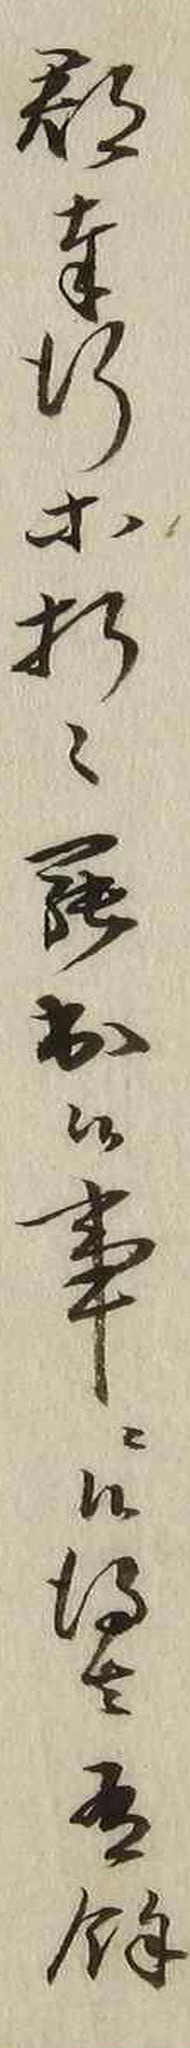郡奉行等折々罷出候事に候得は有餘
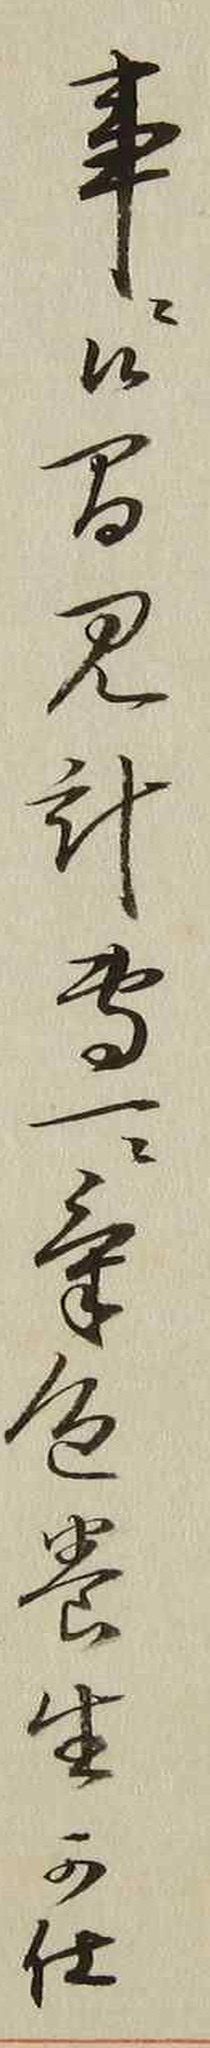事に候間見計専一に気色養生可仕
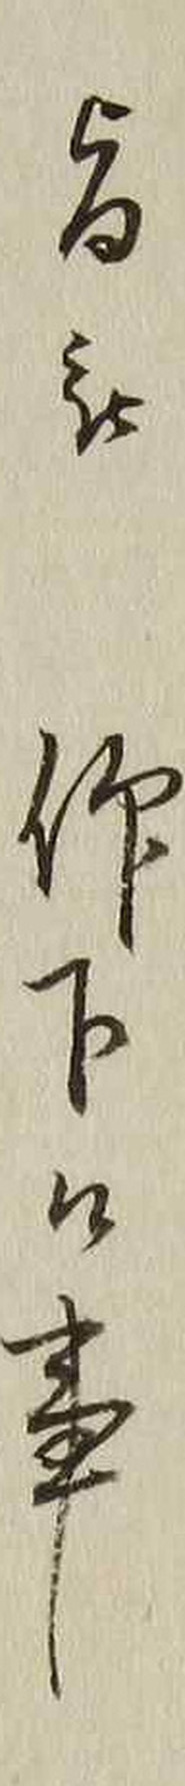旨被仰下候事
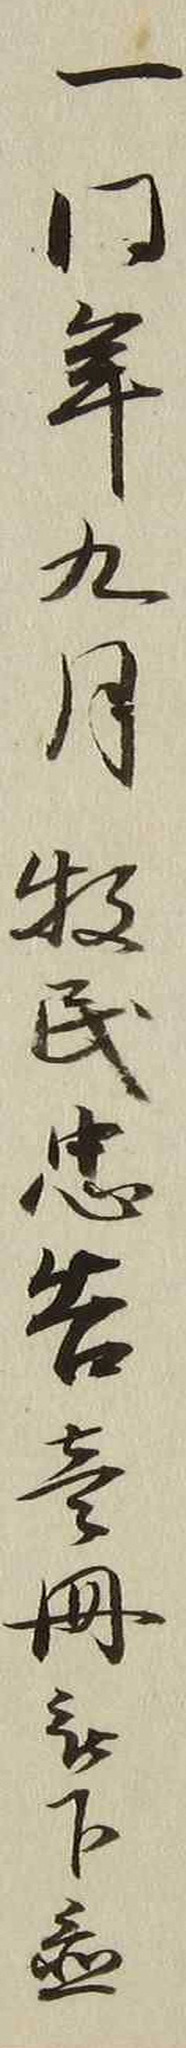一同年九月牧民忠告壱冊被下置
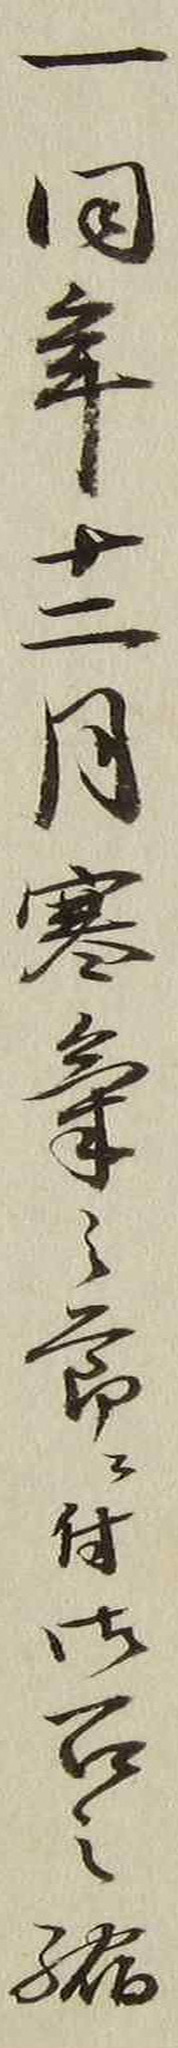一同年十二月寒気之節に付御召之縮
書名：諸士系譜　巻之125　た之部1
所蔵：会津若松市立会津図書館
